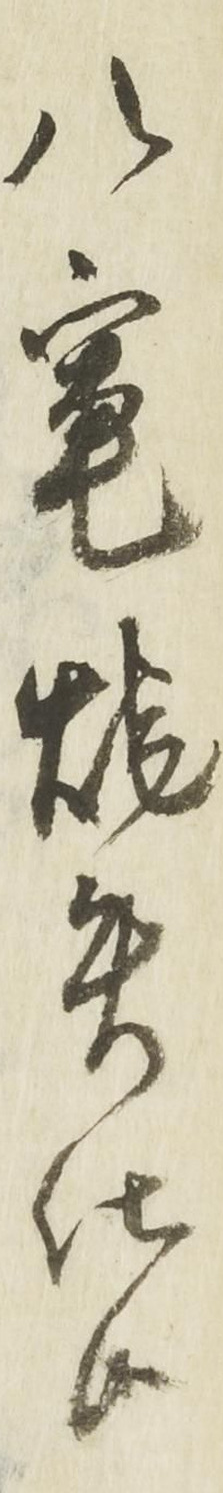八竈焼失仕候
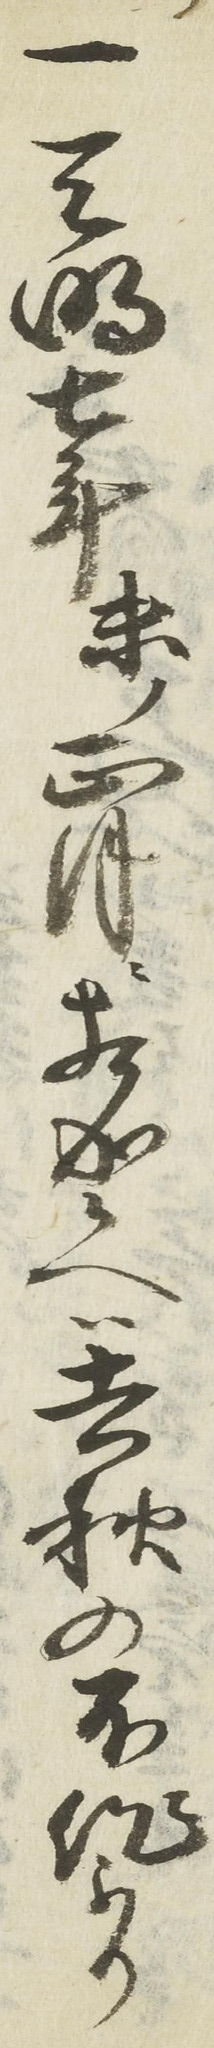一天明七年未ノ正月ニ相成候へは去秋の不作より
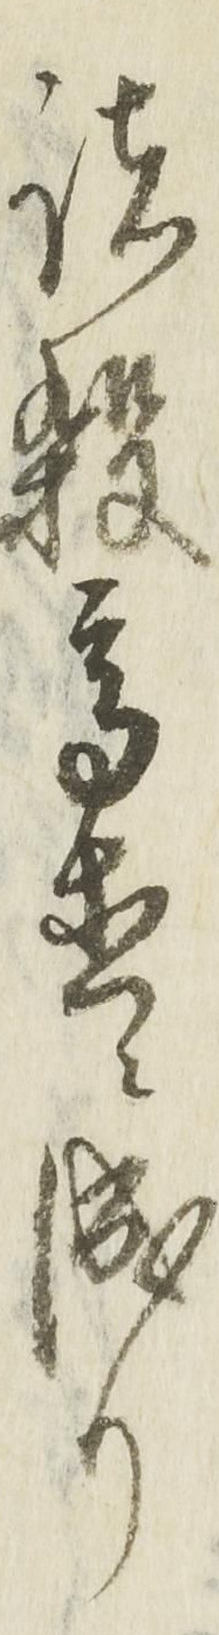諸穀高直ニ成り
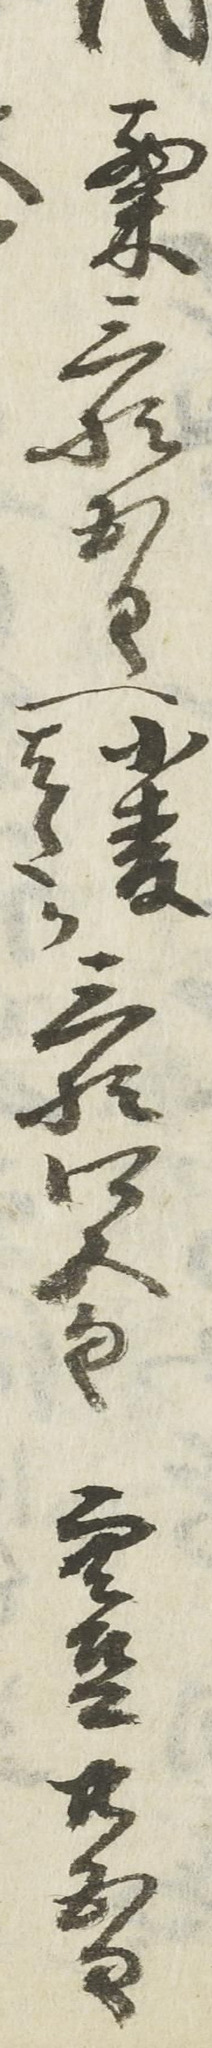粟三拾五匁小麦はたケ三拾四五匁空豆廿五匁
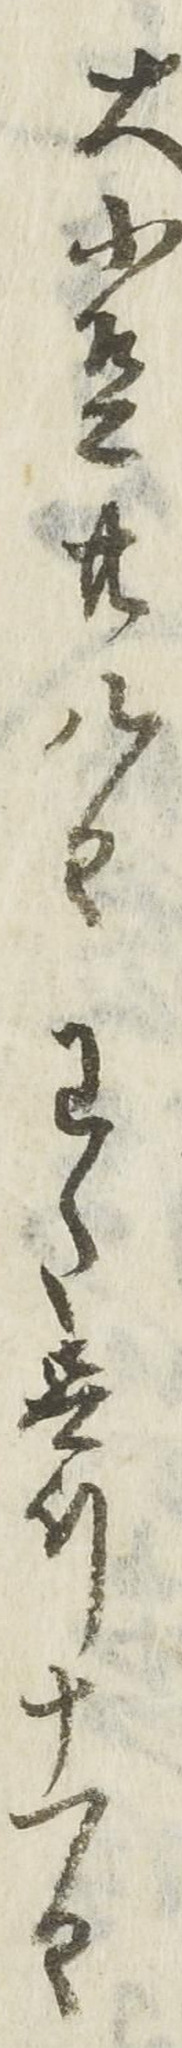大小豆廿八匁わた壱斤十一匁
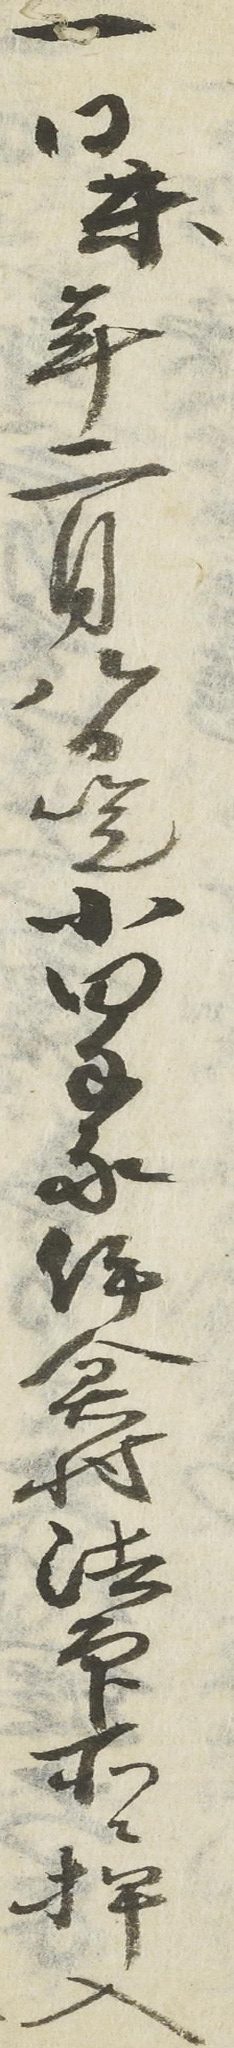一同未年二月八日晩小田手家伊倉村法印所ニ押入
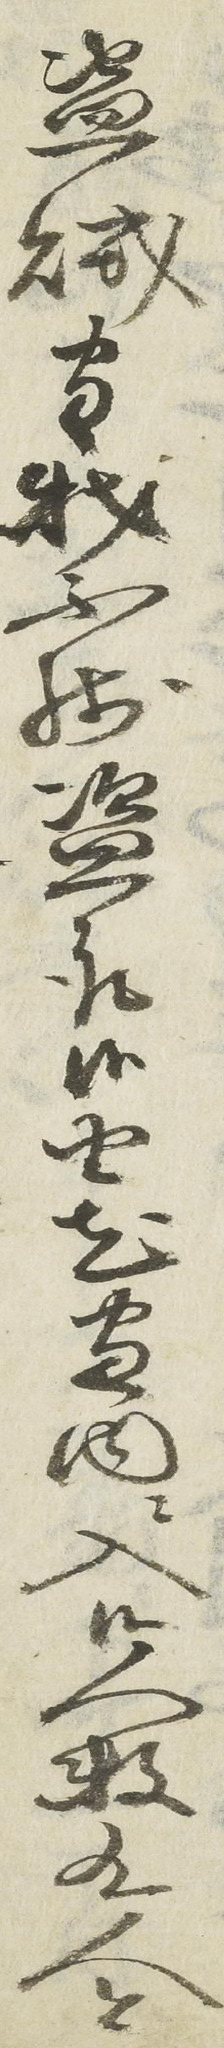盗賊家財不残盗取候由尤家内ニ入候人数九人と
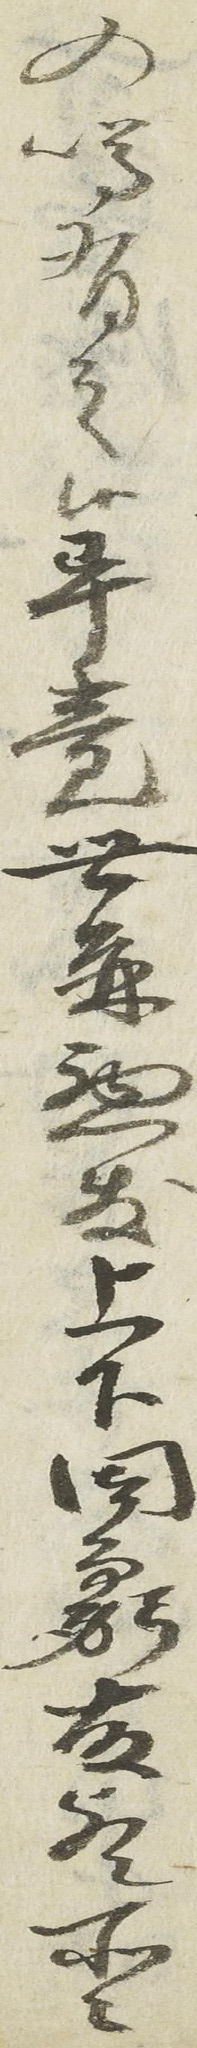の噂有之候畢竟無並悪敷上下因る躬故歟所〻
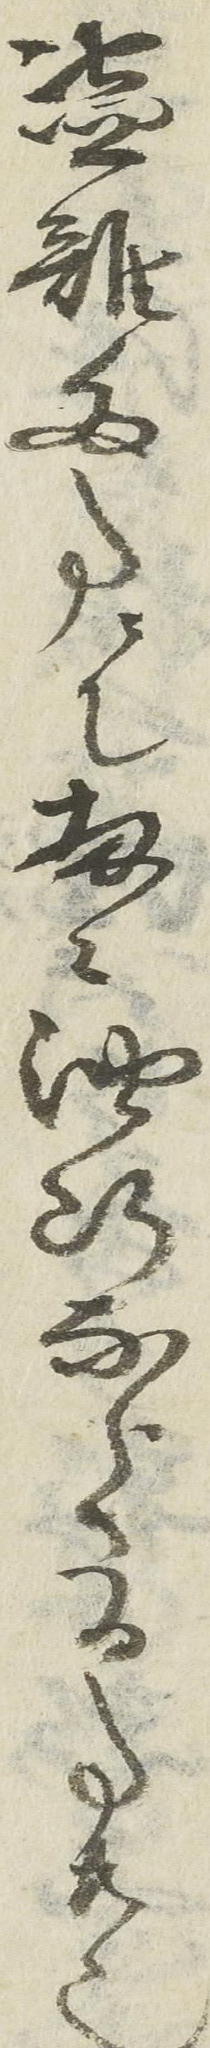盗難た事ニて扨〻油断ならさる事共也

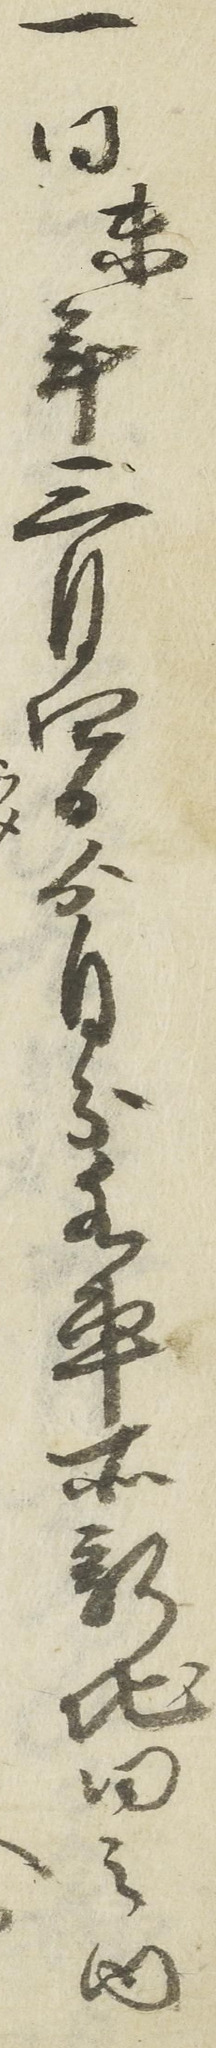一同未年三月四日ゟ自分水車所新地田之内
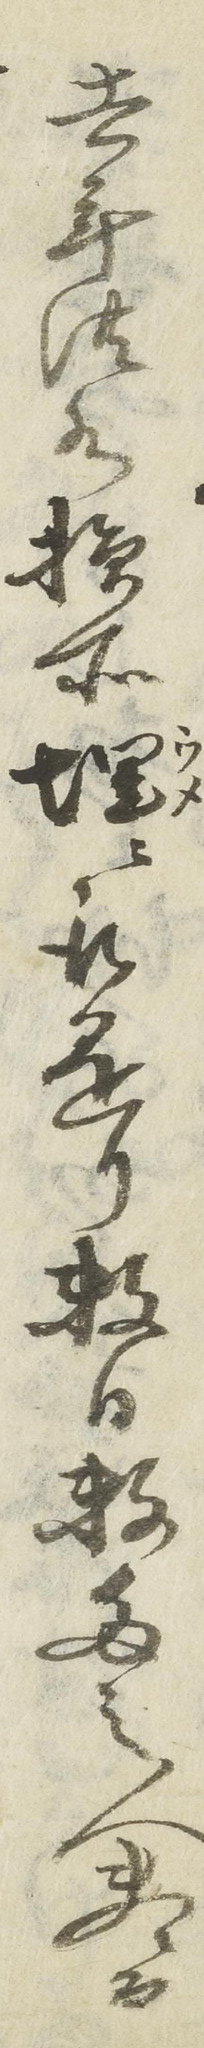去年洪水損所埋ニ取懸り数日数多之人夫ニ而
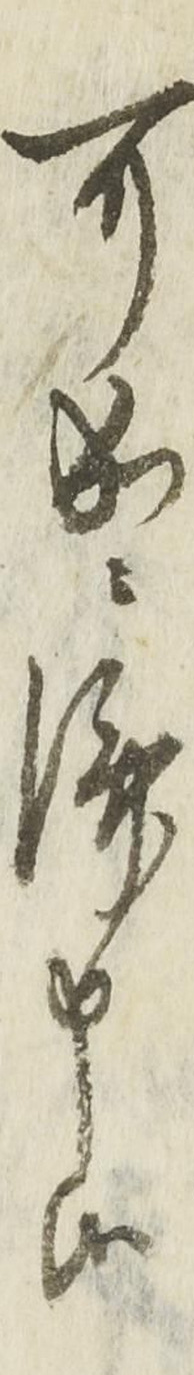可成ニ済申候
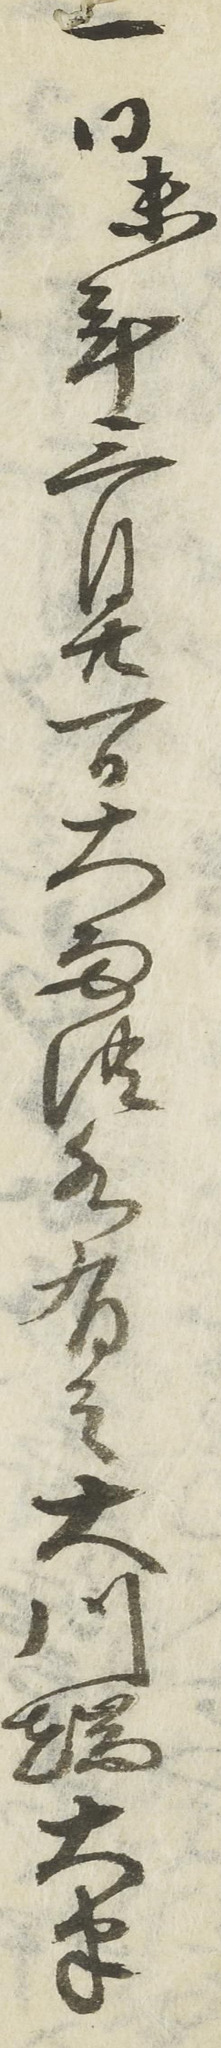一同未年三月廿一日大雨洪水有之大川端大半
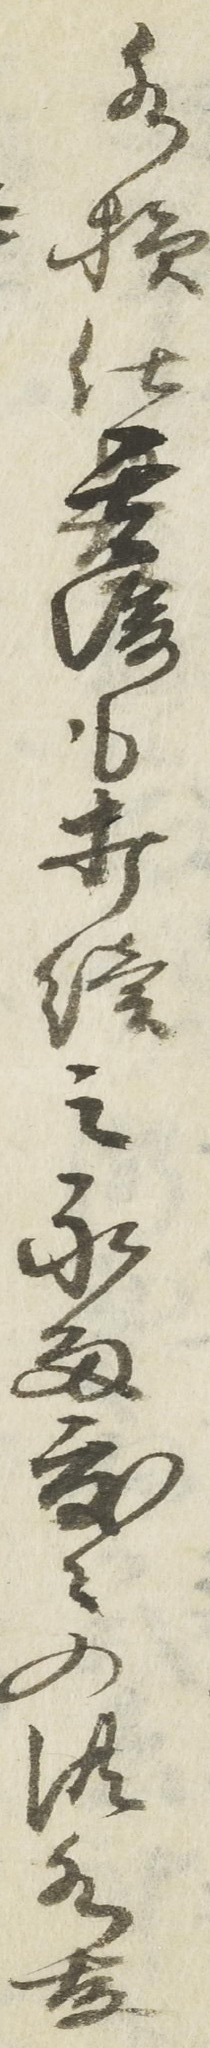水損仕其後も打続之永雨度〻の洪水故
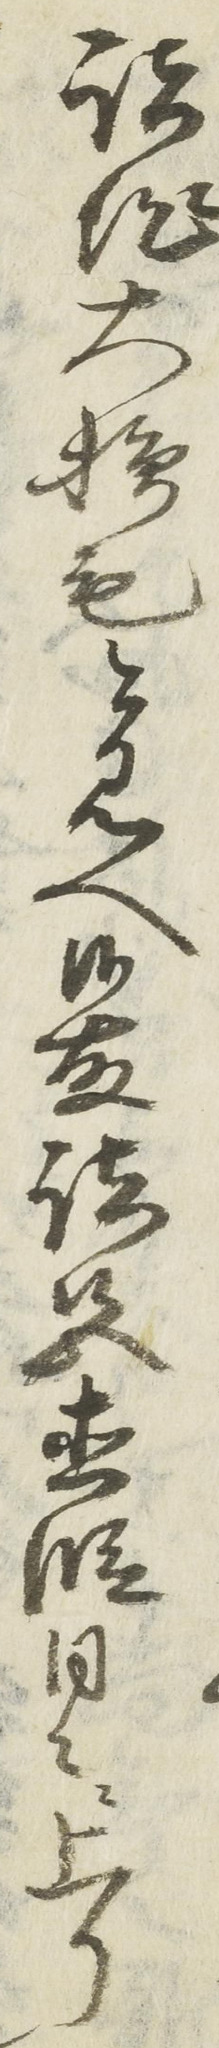諸作大損毛と見へ候故諸色直段日〻ニ上り
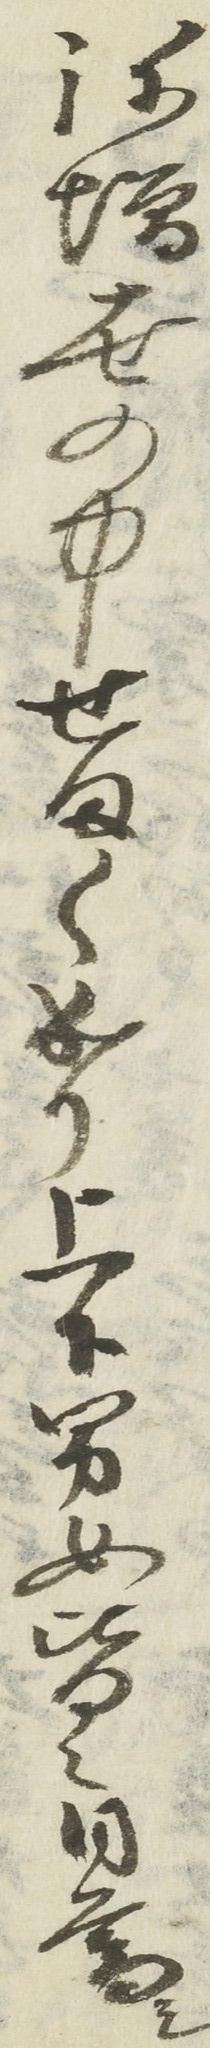弥増世の中せまく成り上下男女皆〻日暮シ
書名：後見笑
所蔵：東京大学地震研究所図書室 Earthquake Research Institute Library, The University of Tokyo, JAPAN
